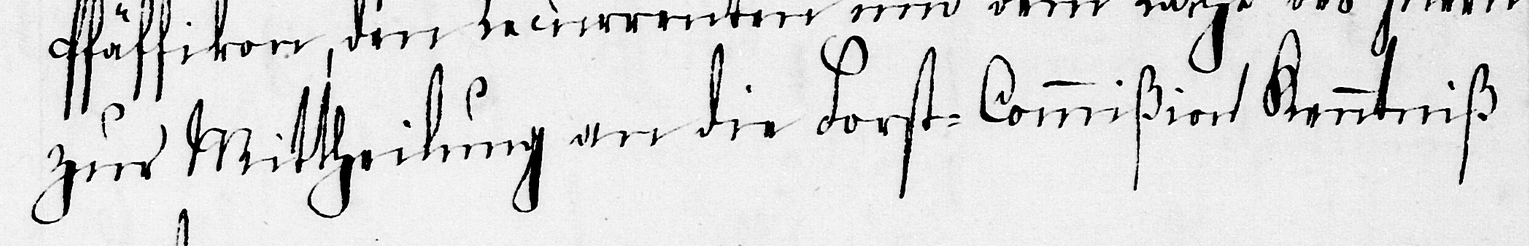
zur Mittheilung an die Forst-Commißion Kenntniß
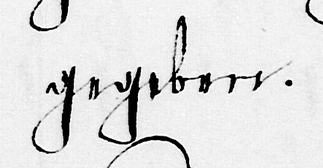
gegeben.
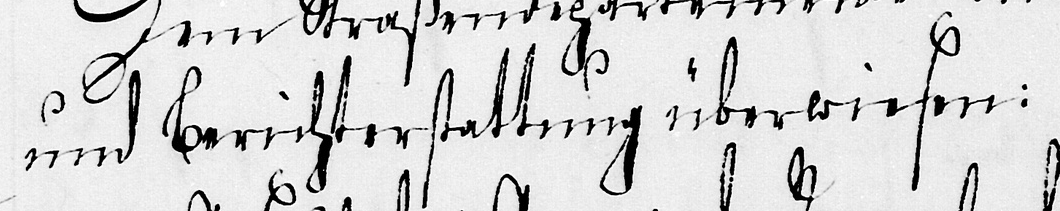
und Berichterstattung überwiesen:
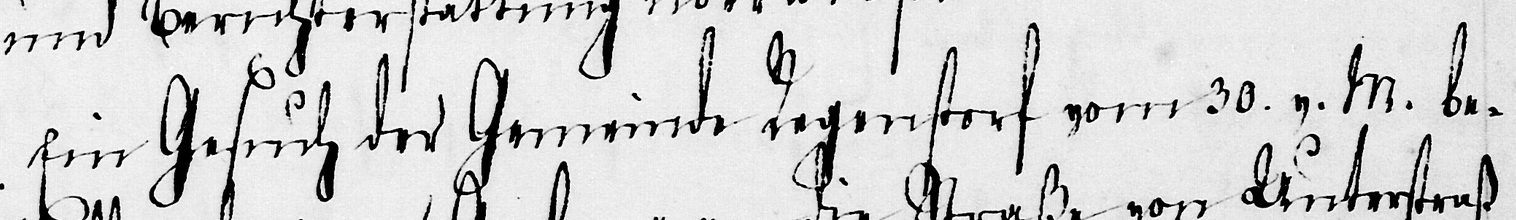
Ein Gesuch der Gemeinde Regenstorf vom 30. v. M. b¬
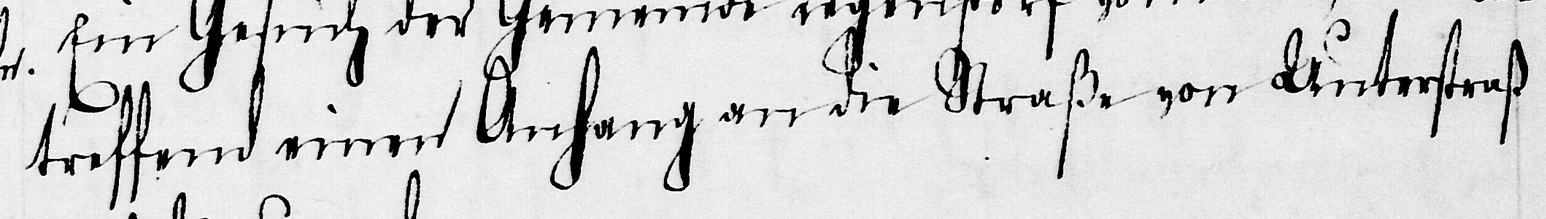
etreffend einen Anhang an die Straße von Unterstraß
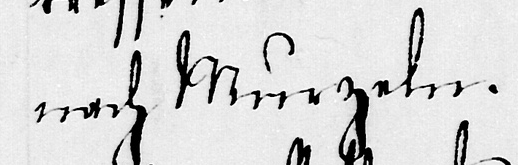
nach Murzeln.
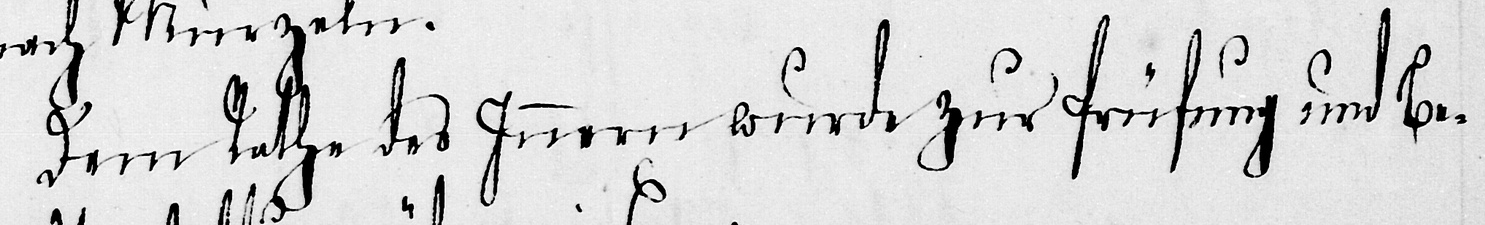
Dem Rathe des Innern wurde zur Prüfung und Be¬
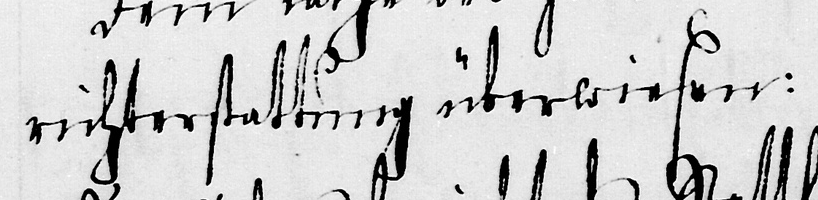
richterstattung überwiesen:
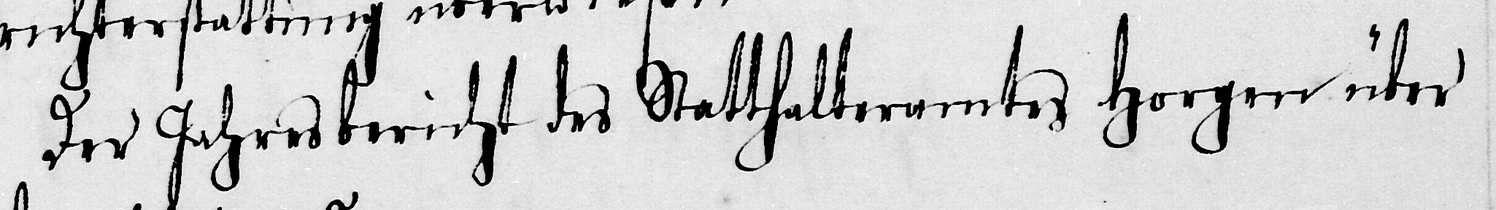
Der Jahresbericht des Statthalteramtes Horgen über
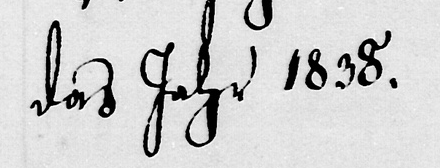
das Jahr 1838.
